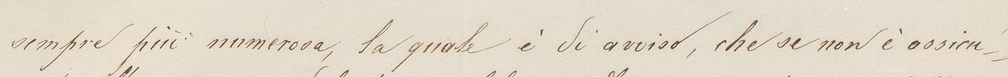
sempre più numerosa, la quale è di avviso, che se non è assicu-
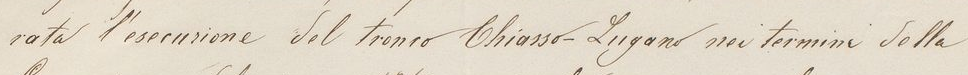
rata l'esecuzione del tronco Chiasso–Lugano nei termini della
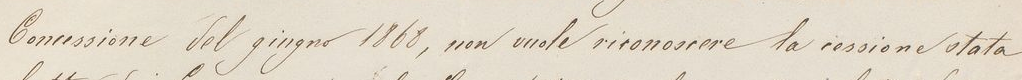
Concessione del giugno 1868, non vuole riconoscere la cessione stata
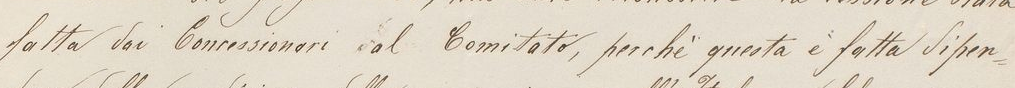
fatta dai Concessionari al Comitato, perchè questa è fatta dipen-
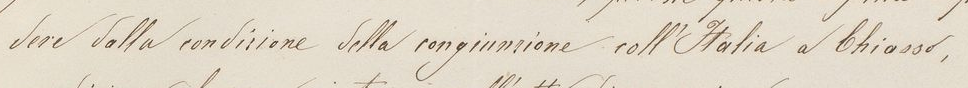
dere dalla condizione della congiunzione coll'Italia a Chiasso,
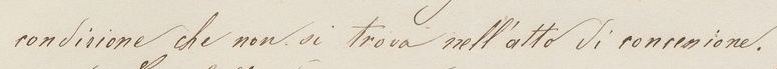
condizione che non si trova nell'atto di concessione.
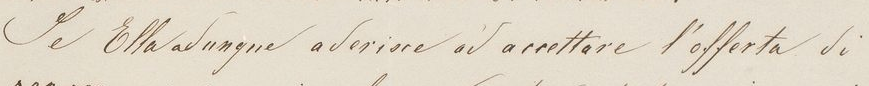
Se Ella adunque aderisce ad'accettare l'offerta di
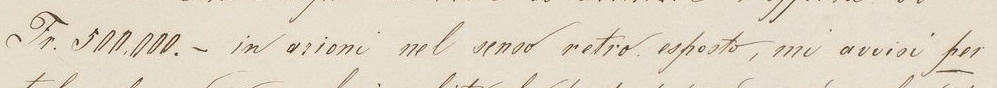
Fr. 500,000.– in azioni nel senso retro esposto, mi avvisi per
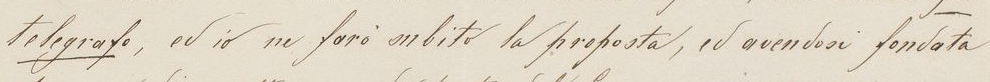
telegrafo, ed io ne farò subito la proposta, ed avendosi fondata
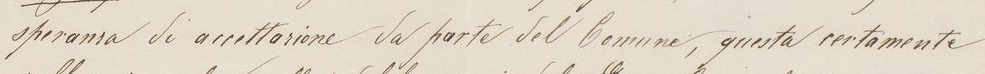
speranza di accettazione da parte del Comune, questa certamente
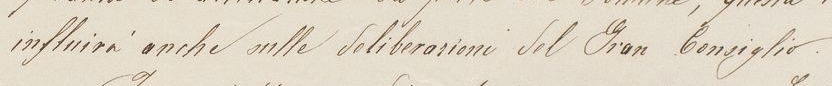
influirà anche sulle deliberazioni del Gran Consiglio.
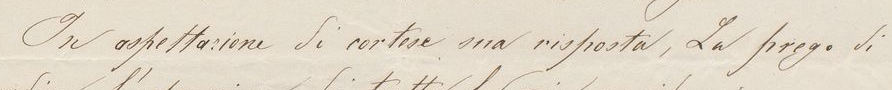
In aspettazione di cortese sua risposta, La prego di
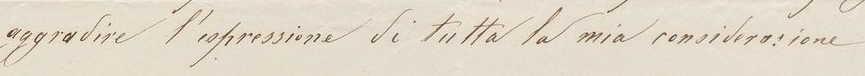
aggradire l'espressione di tutta la mia considerazione
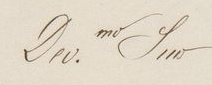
Devmo Suo
